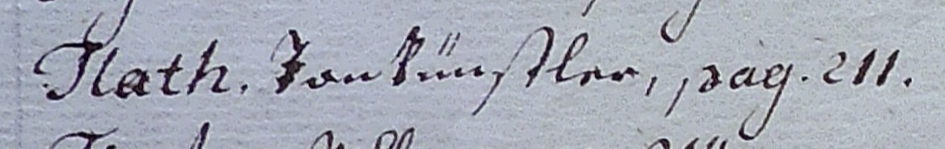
Flath. Tonkünstler, pag. 211.
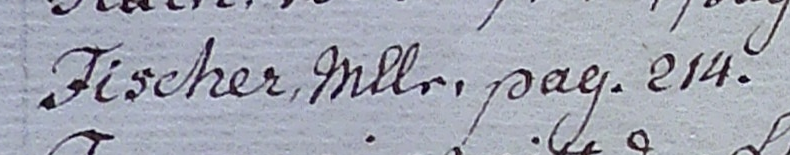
Fischer, Mlle. pag. 214.
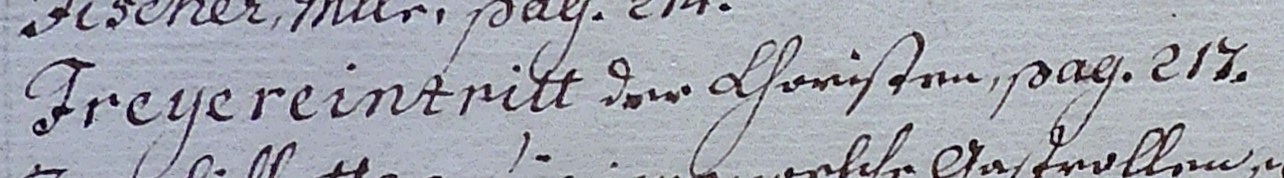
Freyereintritt der Choristen, pag. 217.
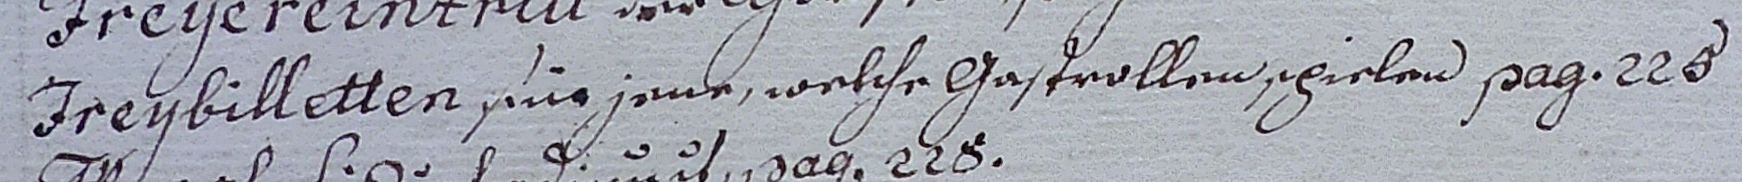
Freybilletten für jene, welche Gastrollen spielen pag. 225
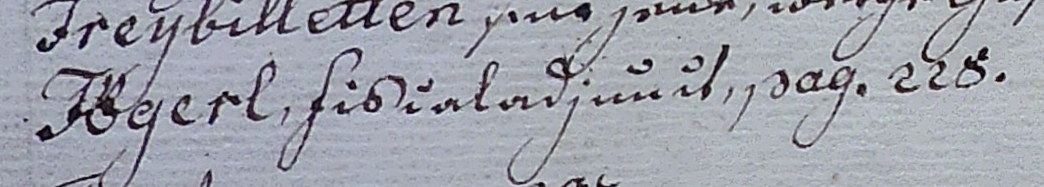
Fögerl, Fiscaladjunct, pag. 228.
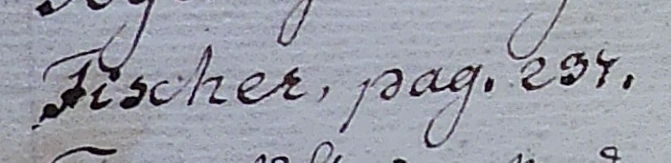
Fischer, pag. 237.
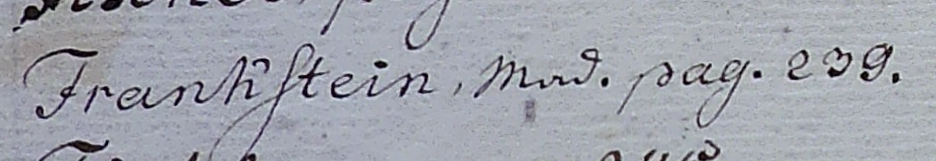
Frankstein, Mad. pag. 239.
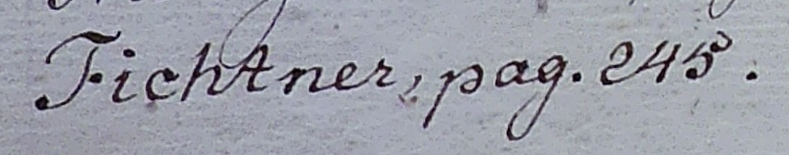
Fichtner, pag. 245.
